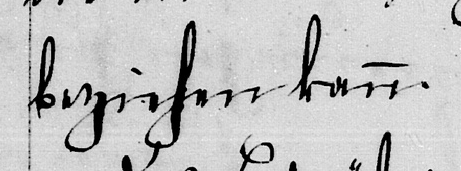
beziehen kann.
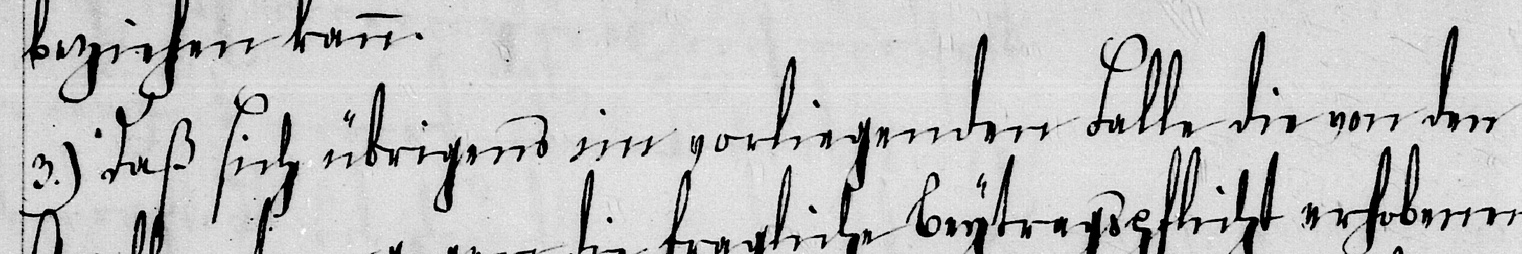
3.) Daß sich übrigens im vorliegenden Falle die von den
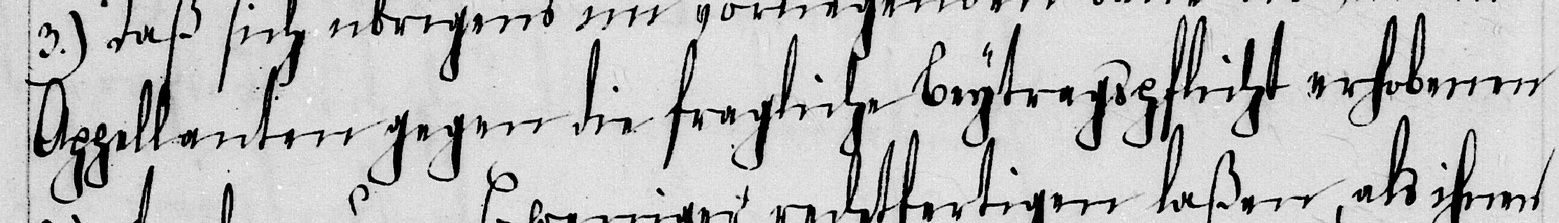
Appellanten gegen die fragliche Beytragspflicht erhobenen
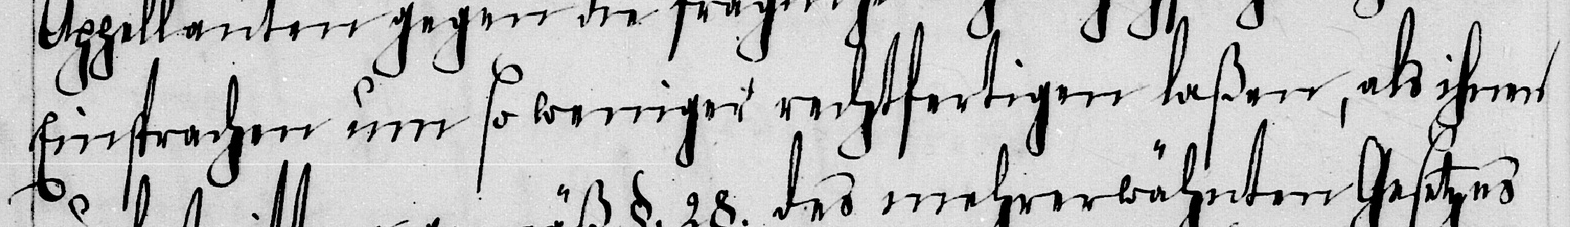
Einsprachen um so weniger rechtfertigen laßen, als ihnen
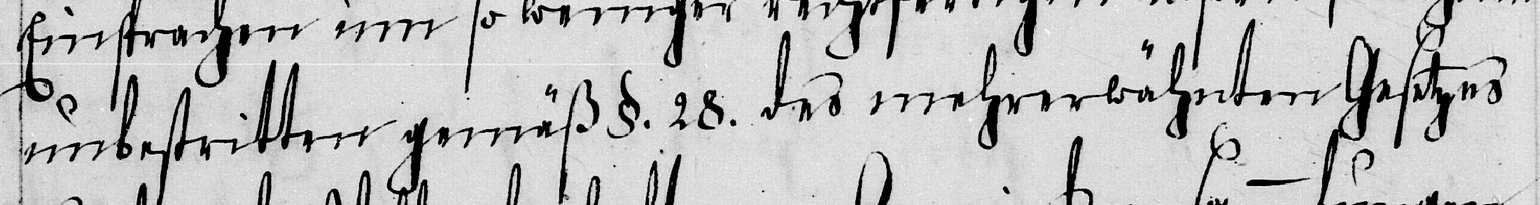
unbestritten gemäß §. 28. des mehrerwähnten Gesetzes
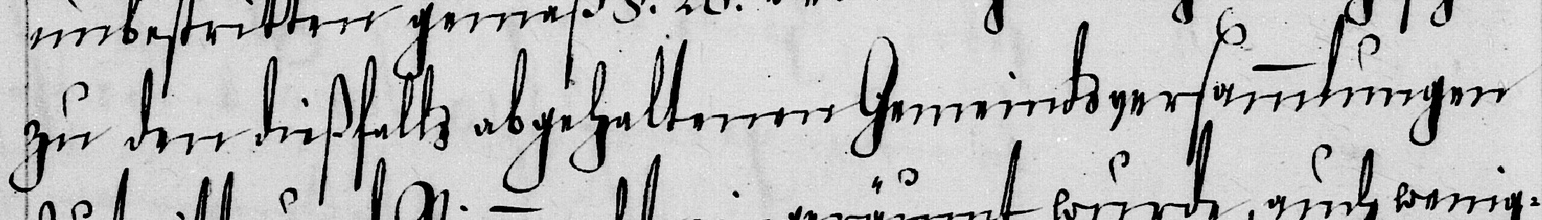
zu den dießfalls abgehaltenen Gemeindsversammlungen
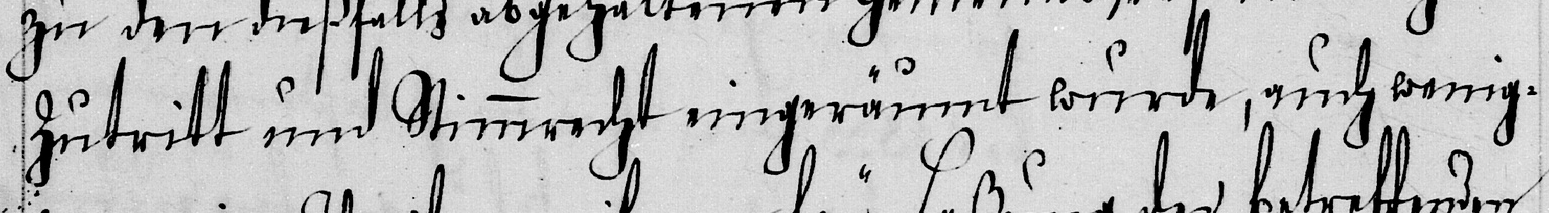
Zutritt und Stimmrecht eingeräumt wurde, auch wenig¬
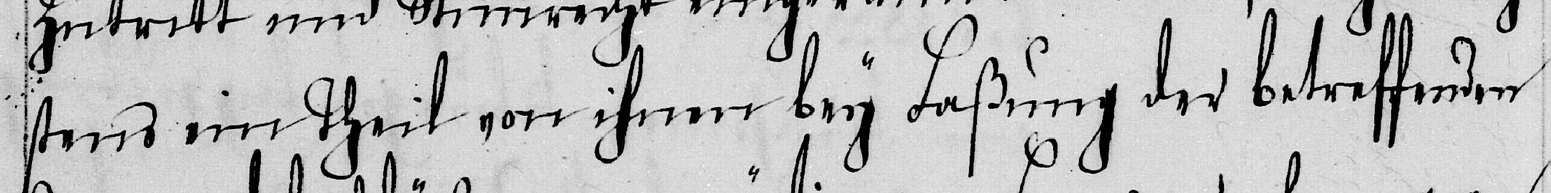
stens ein Theil von ihnen bey Faßung der betreffenden
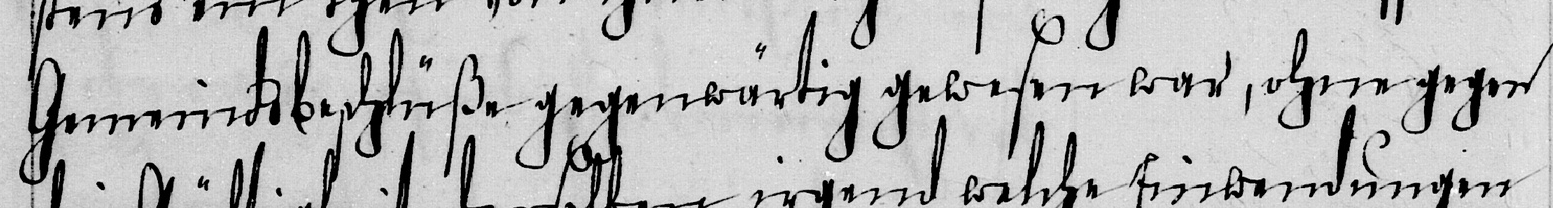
Gemeindsbeschlüße gegenwärtig gewesen war, ohne gegen
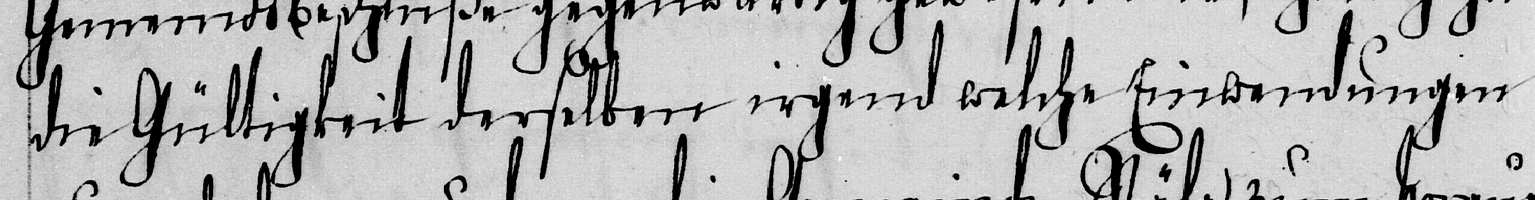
die Gültigkeit derselben irgend welche Einwendungen
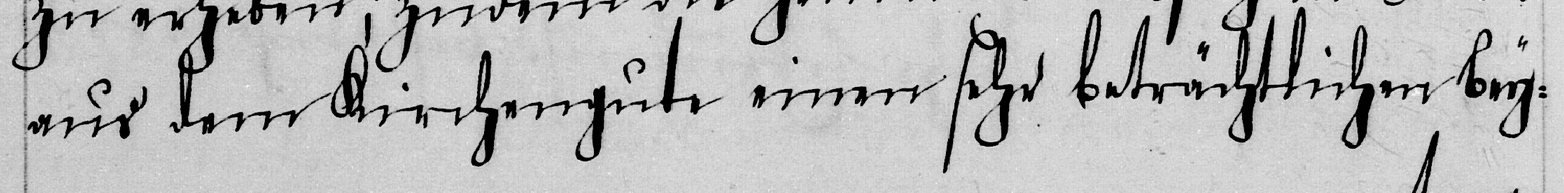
aus dem Kirchengute einen sehr beträchtlichen bey-
